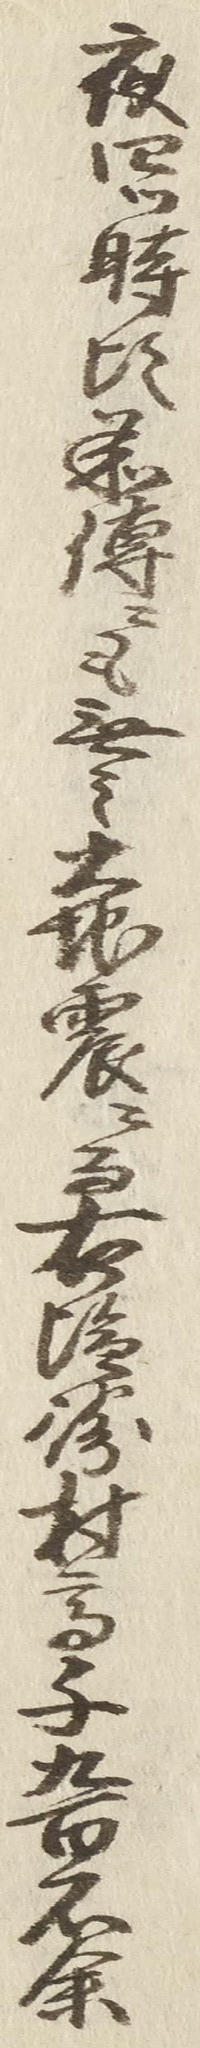夜四ッ時頃承伝二も無之大地震二而右塩崎村高千九百石餘
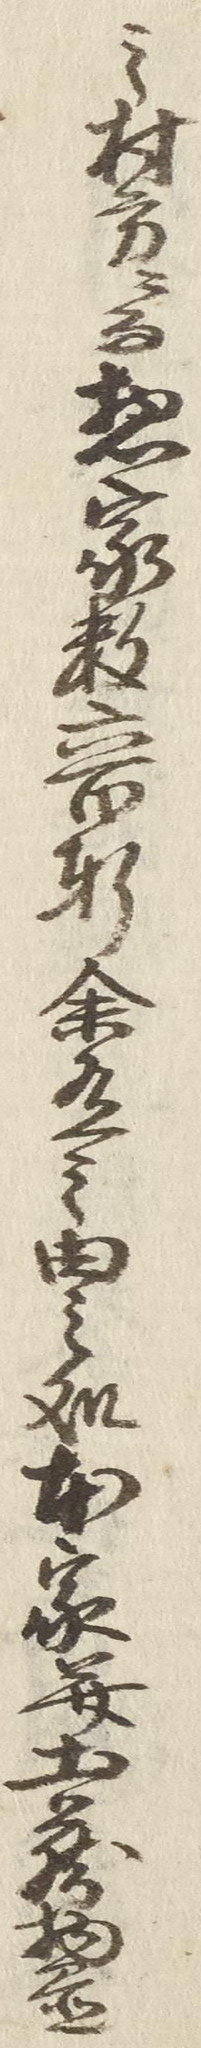之村方二而惣家数六百軒余有之候由之処本家并土蔵物置
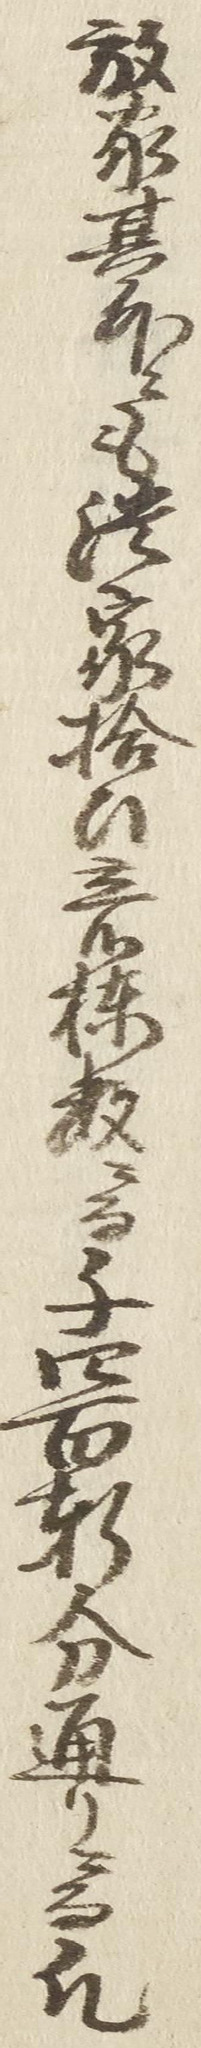放家其外二も潰家捨候立候棟数二千四百軒分通二而凡
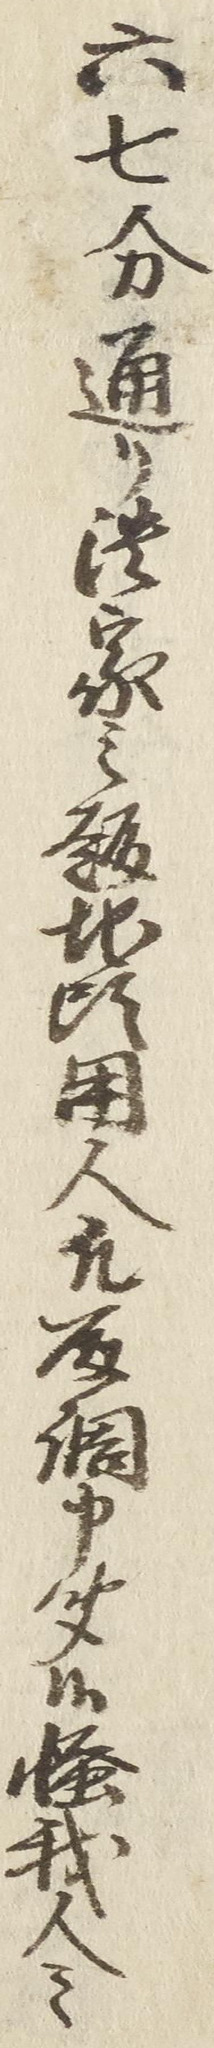六七分通り潰家之趣地頭用人凡取調申聞候怪我人之
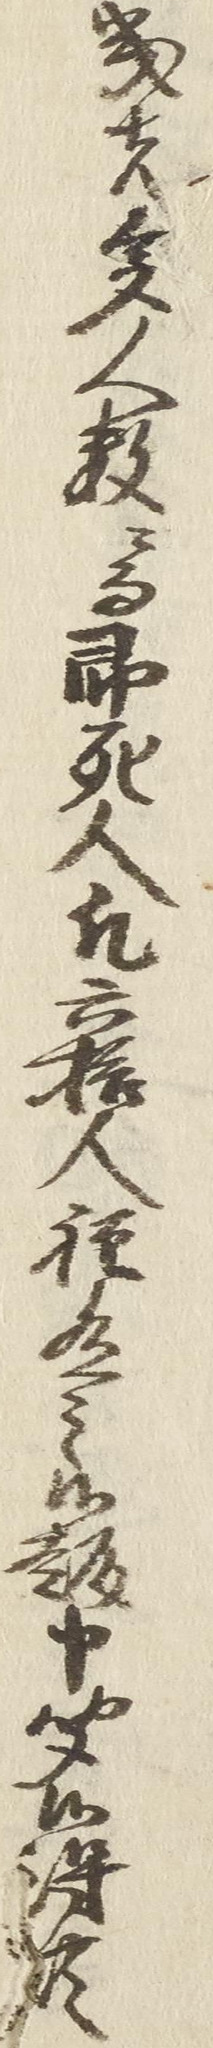義は多人数二而即死人凡六拾人程有之候趣申聞候得共
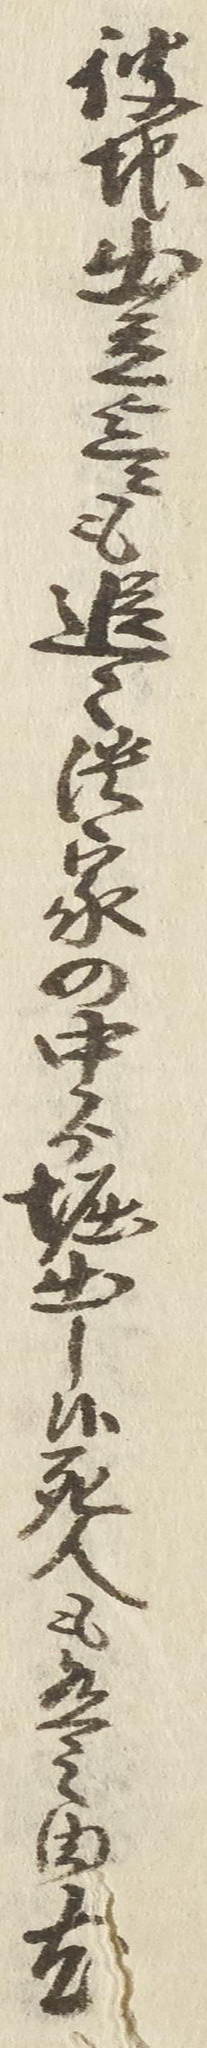彼地出立迄二も追々潰家之中ゟ掘出候死人有之由尤
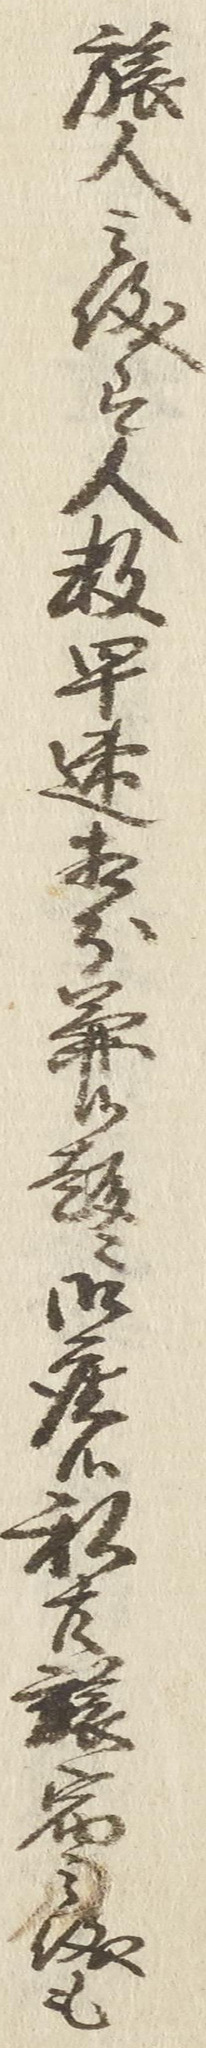旅人之儀は人数早速相分兼候趣二御座候私共旅宿之儀も
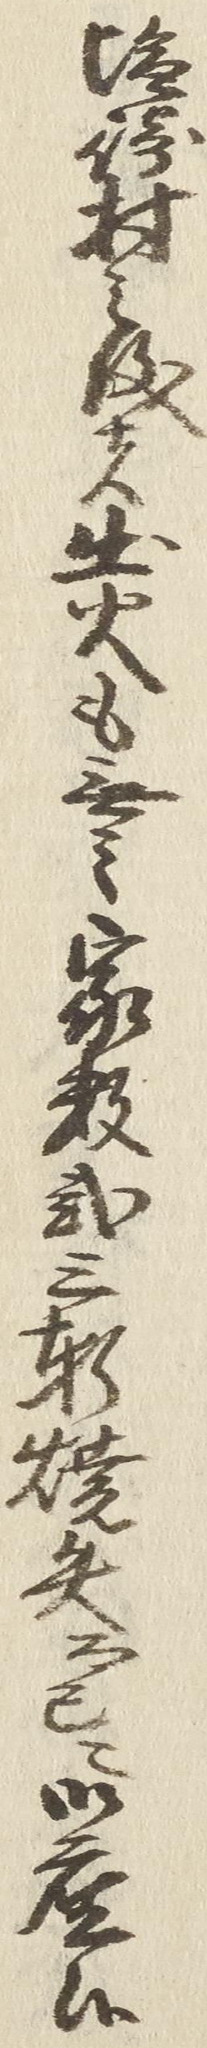塩崎村之儀は出火も無之家数弐三軒焼失而已二御座候
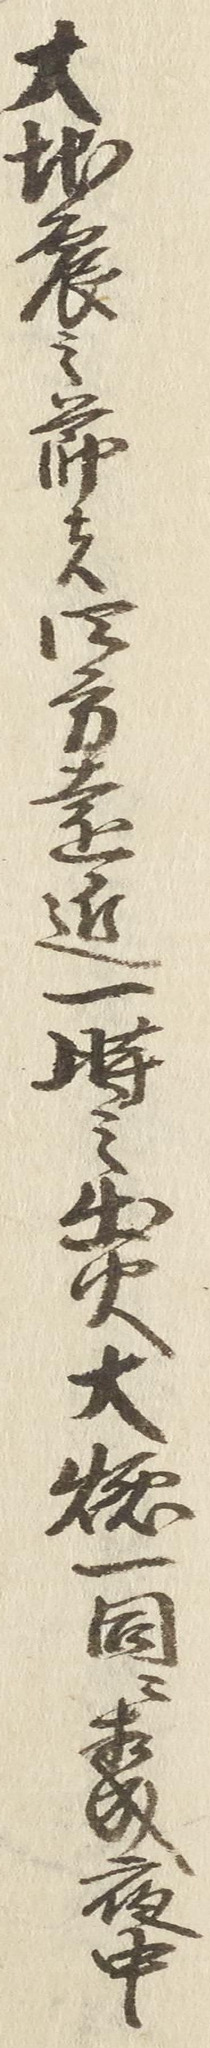大地震之節ハ四方遠近一時二出火大煙り一同二相成夜中
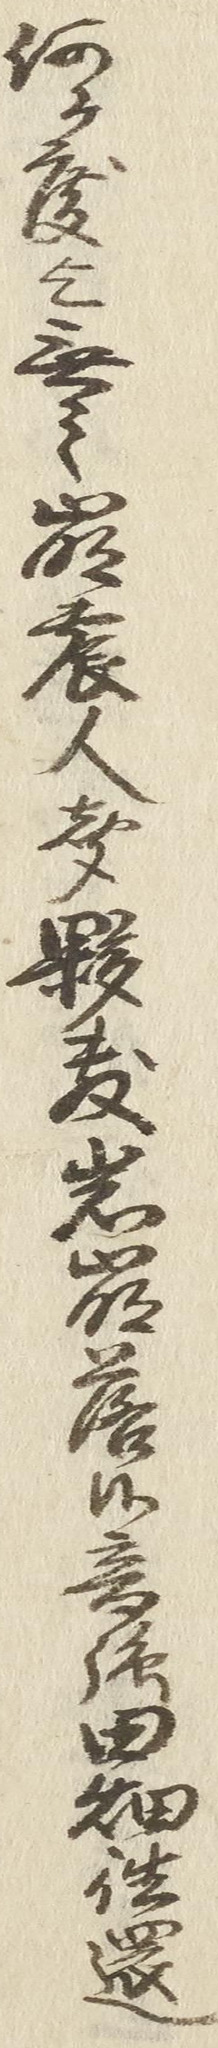何ヶ度と無之崩震人声夥敷岩崩落候音響強田畑往還
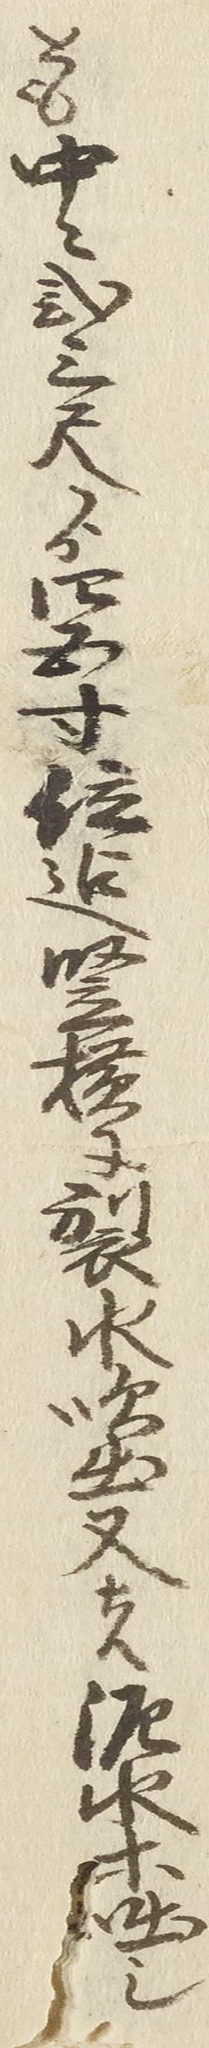とも中々弐三尺ゟ四五寸位迄竪横二裂水吹出又は泥水等吹出し
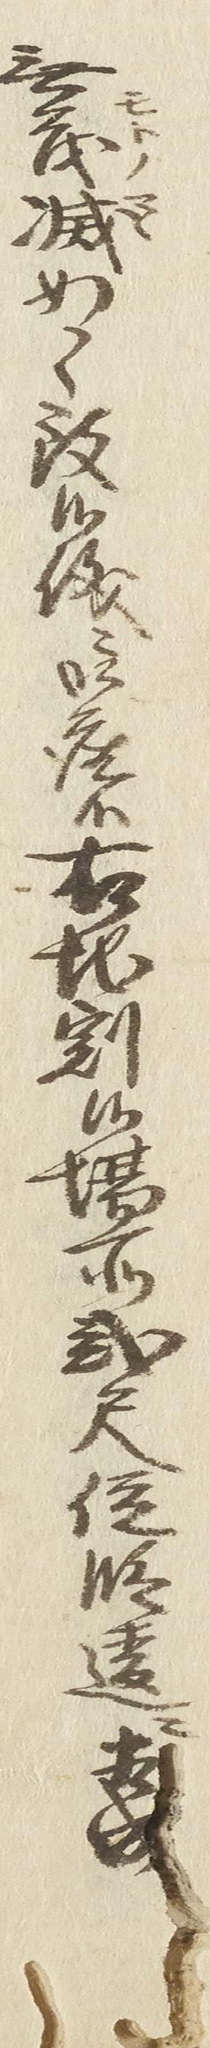無も減如く致候義二御座候右地割候場所弐尺位段違二相成
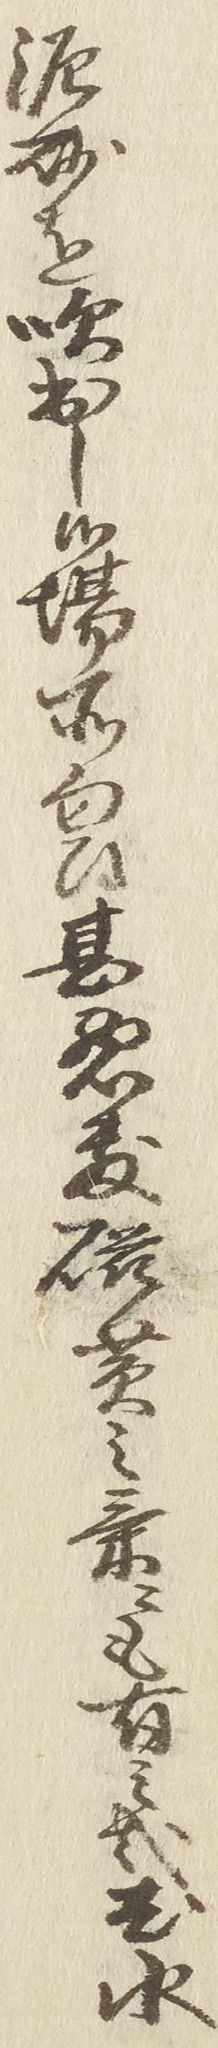泥砂を吹出し候場所匂ひ甚悪敷硫黄之気二も有之哉尤水
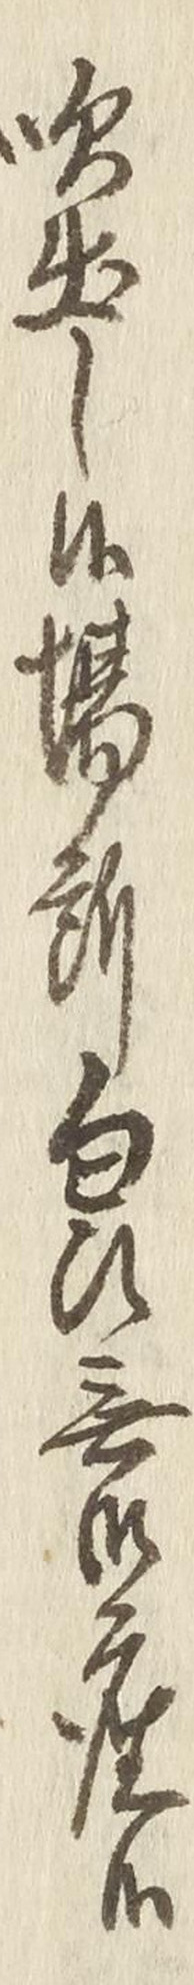吹出し候場所匂ひ無御座候
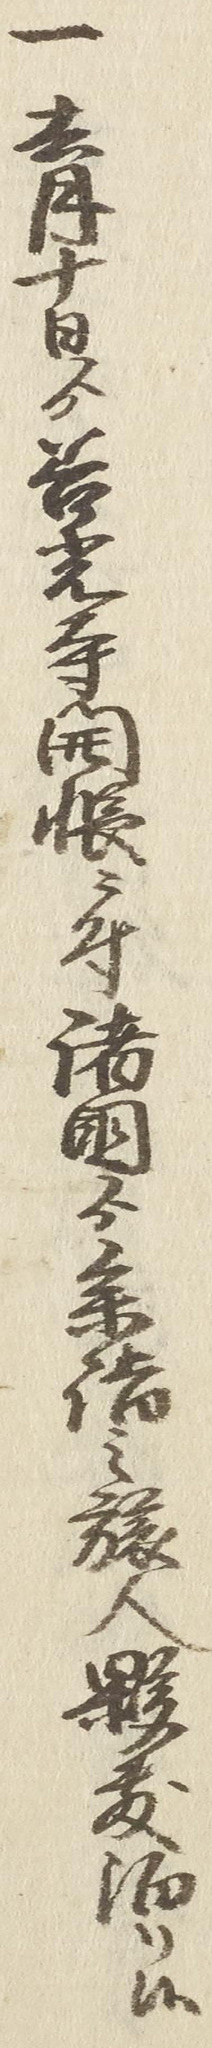一去月十日ゟ善光寺開帳二付諸国ゟ参詣之旅人夥敷多泊り候
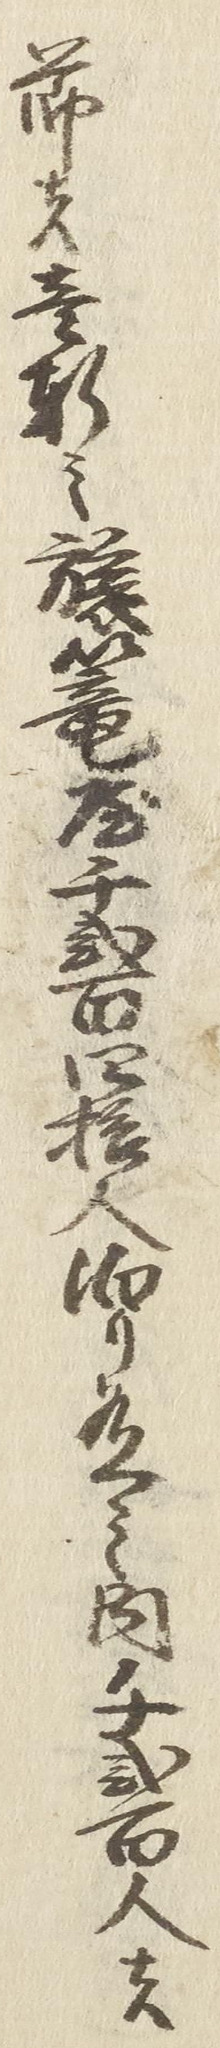節は壱軒之旅籠屋千弐百四拾人泊り有之内千弐百人は
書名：従往古地震御届書記誌之一
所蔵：東京大学地震研究所図書室 Earthquake Research Institute Library, The University of Tokyo, JAPAN
